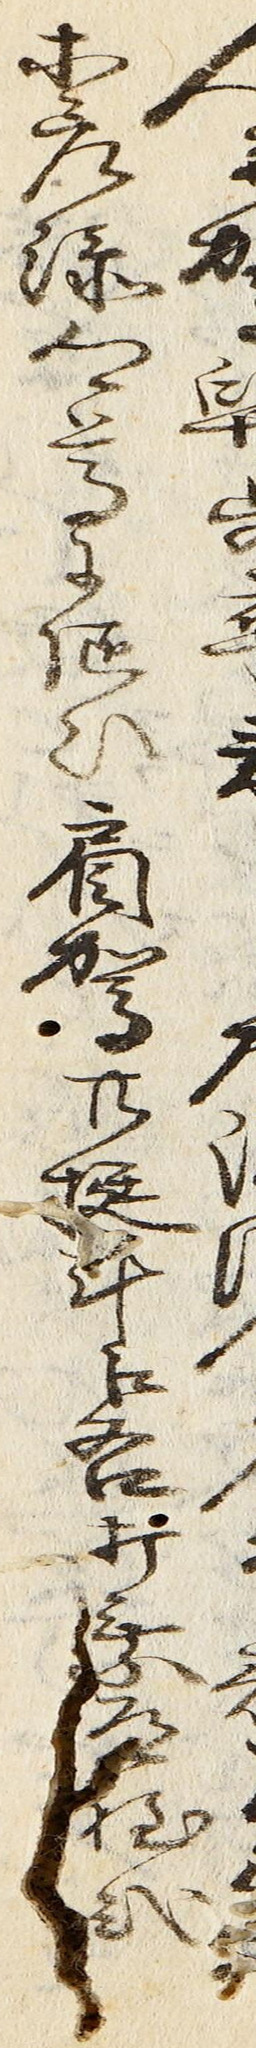等差添郷尊に随ひ肩駕廿挺計え各打乗道程弐
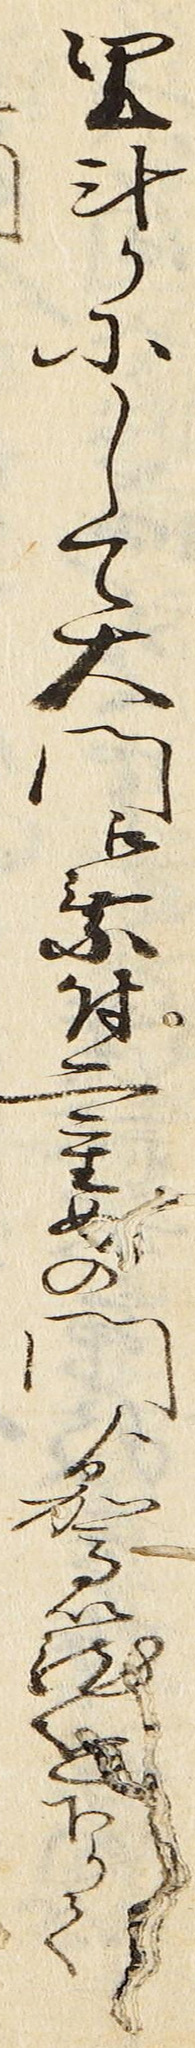里計りにして大門え乗付二重の門ゟ駕籠を下りて
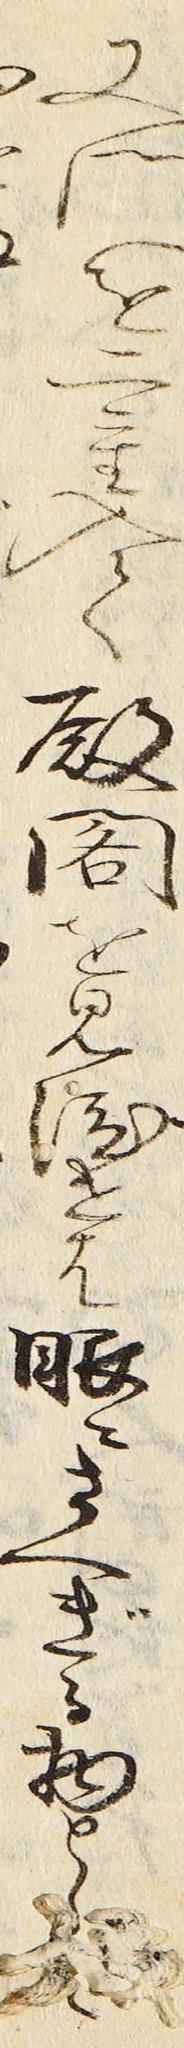又門を二重入て殿閣を見渡せは眼ニさへぎる物として
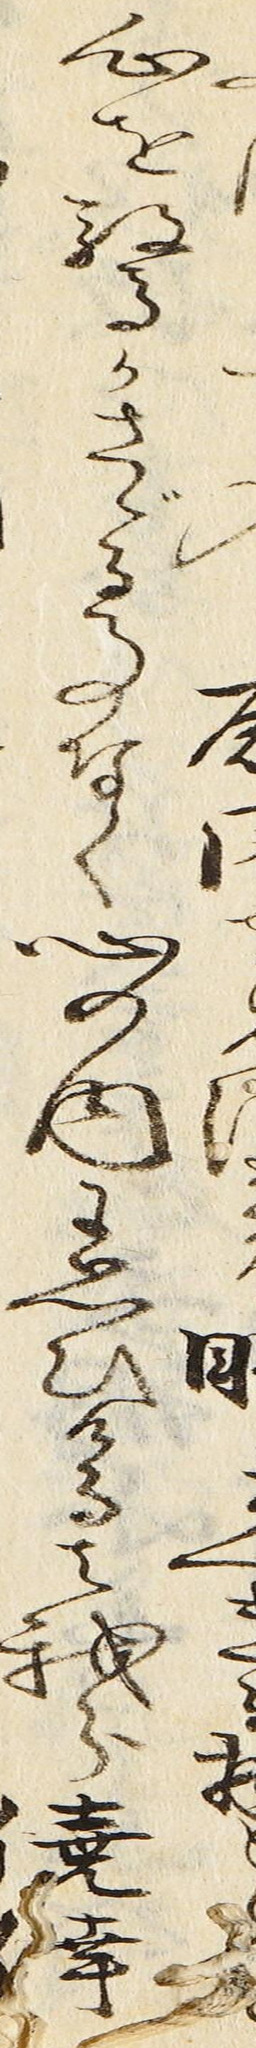心を驚かさゞる事なく心の内に思ひけるは我ら僥倖
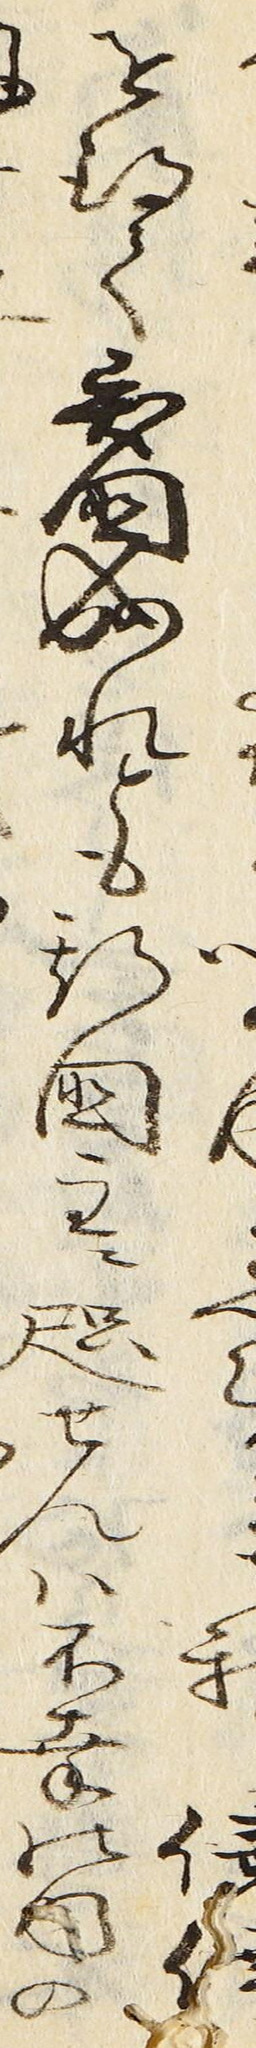を得て異国成れとも斯国主ニ咫せんハ不幸の内の
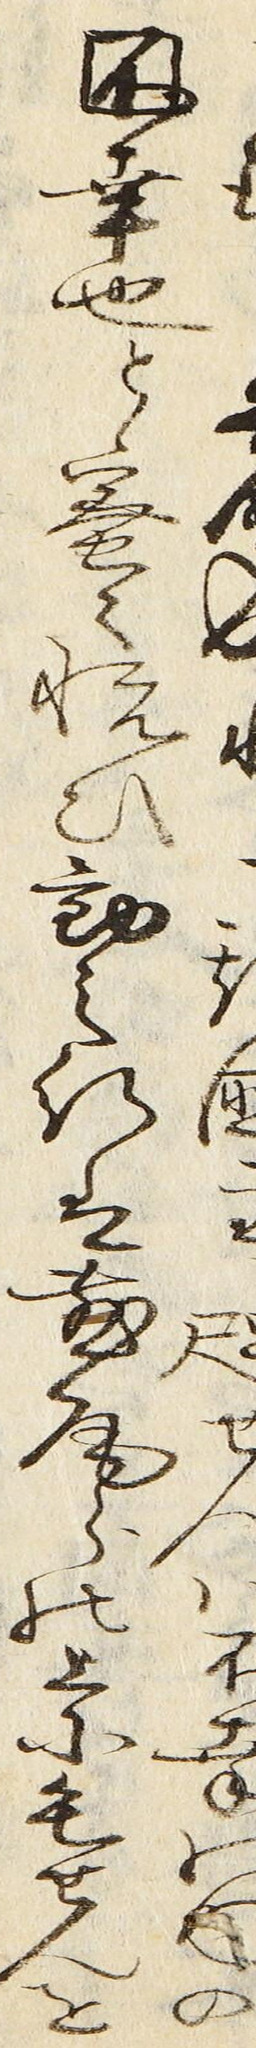不幸也と蜜々悦ひ勧ミ行は敷瓦らの上に毛せんを
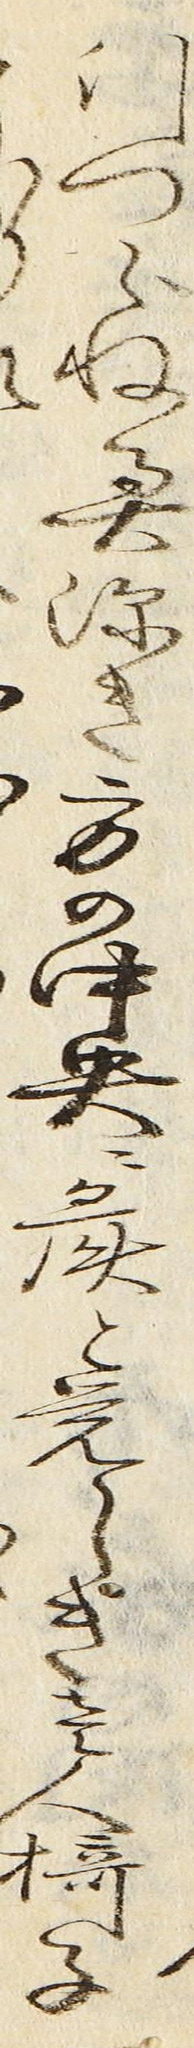引つらね奥深き方の中央ニ侯と覚しき壱人椅子
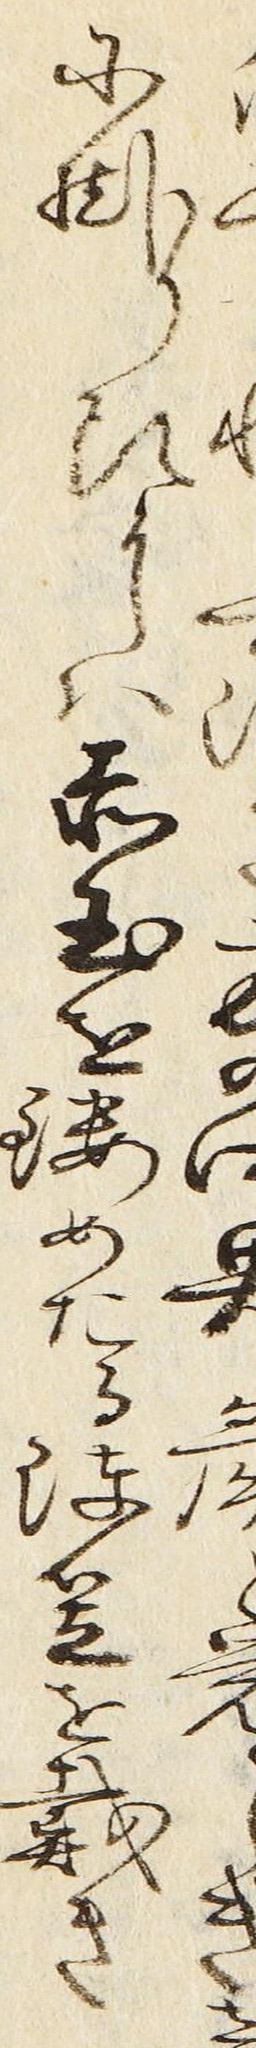に掛り頭にハ赤玉を鏤めたる陣笠を戴き
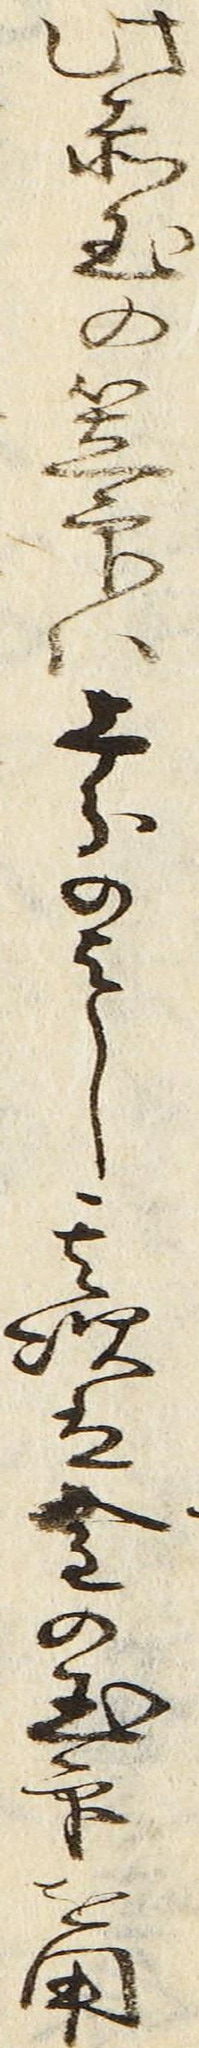此赤玉の笠印ハ上分のよし其次は金の玉印を用
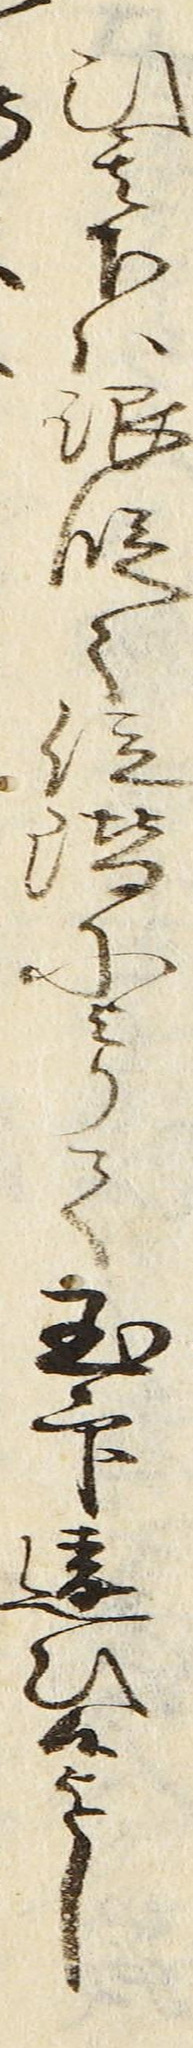ひ其下ハ銀段々位階によりて玉印違ひ候よし
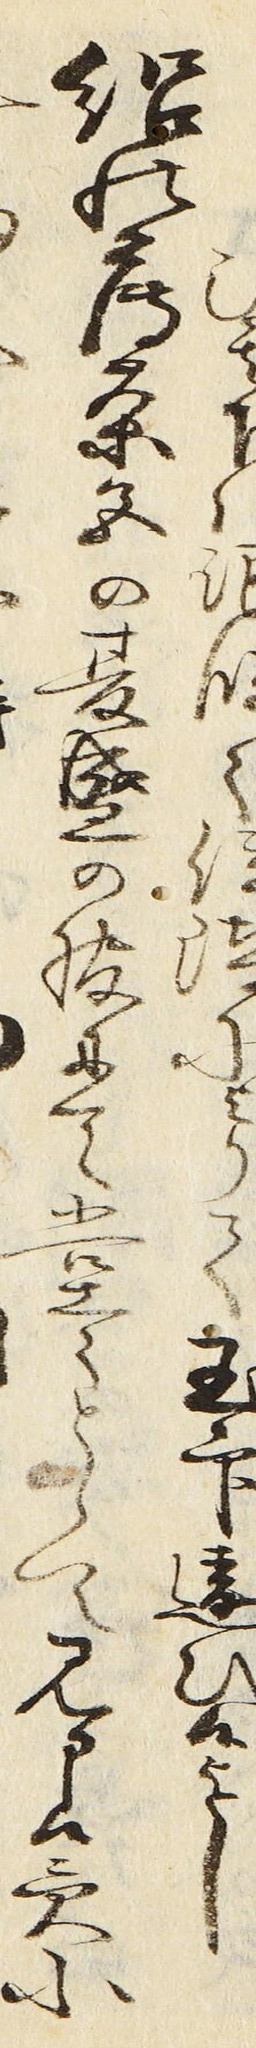絽の薄茶色の夏盛の服にて堂々として見申候美小
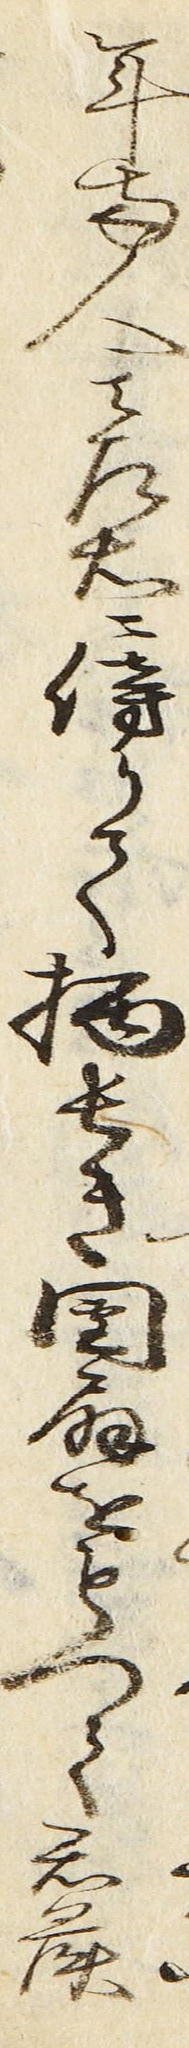年両人其左右ニ侍りて柄長き団扇をもつて君侯
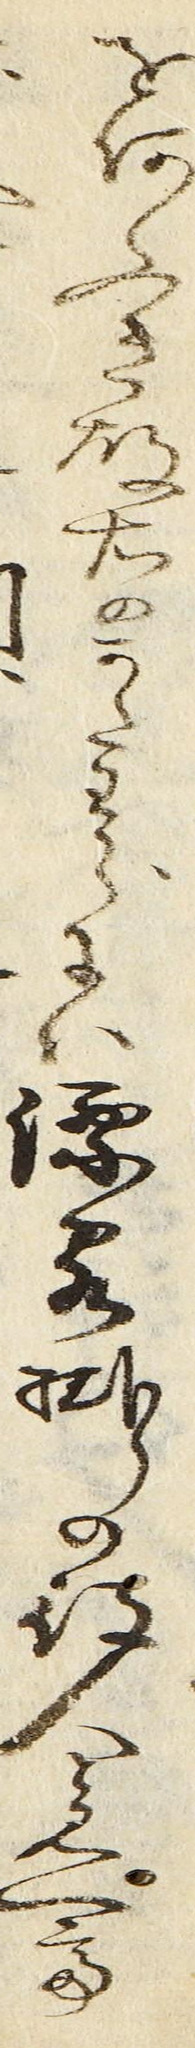をあふき故右のかたわらにハ漂客掛りの役人と見へて
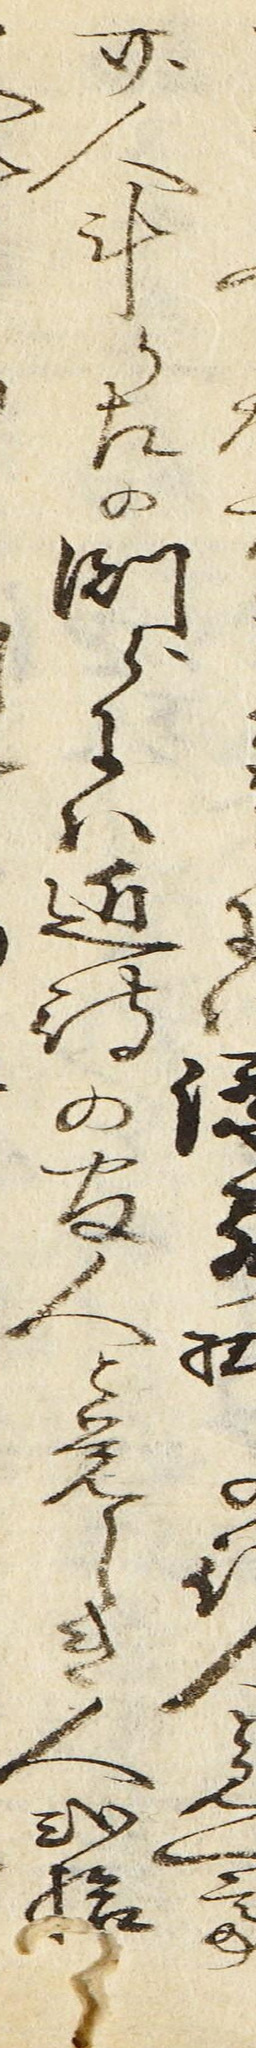廿人計り左の側らにハ近侍の官人と覚しき人弐拾
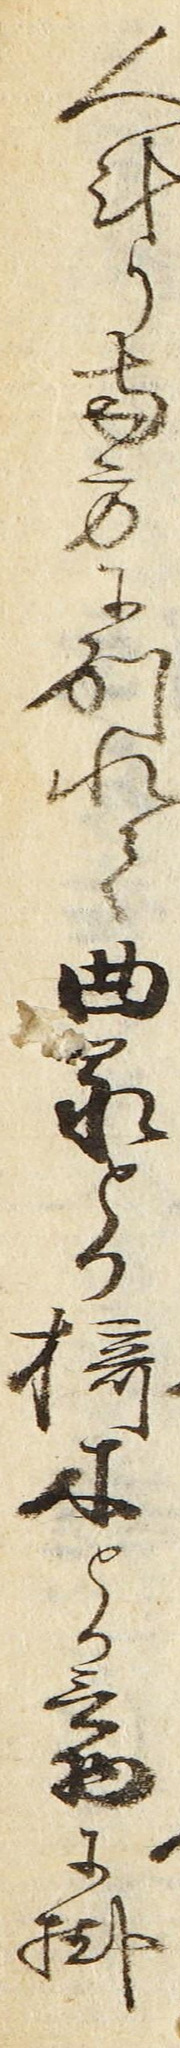人計り両方に別れて曲彔とか椅木とか言物に掛

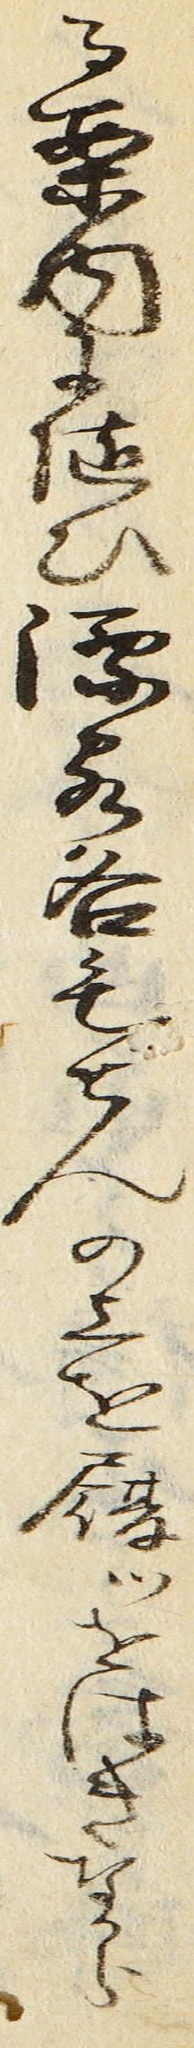る案内に随ひ漂客各毛せんの上を履ツをはきなから
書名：亜墨利加漂流記聞
